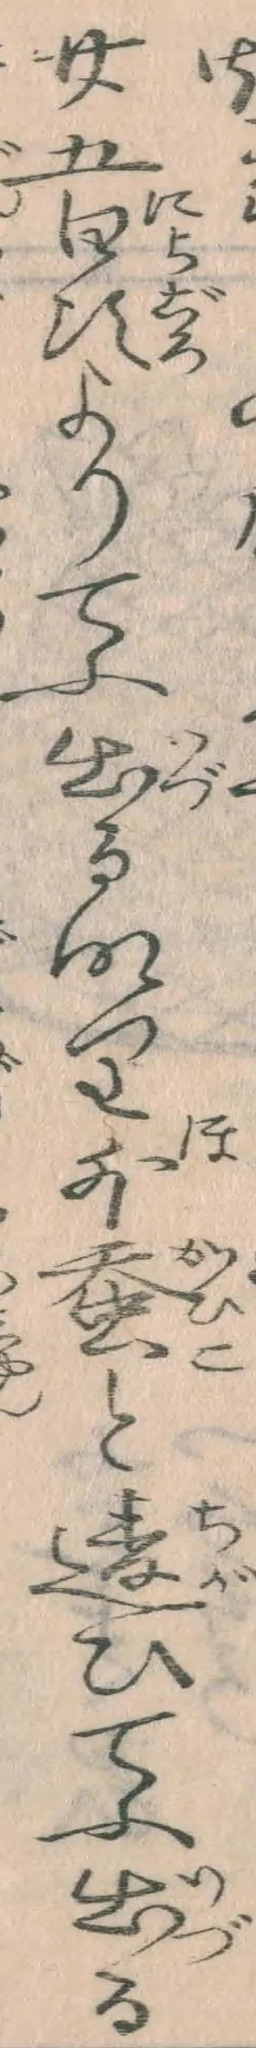廿五日頃よりてふ出るなり外蚕と違ひてふ出る
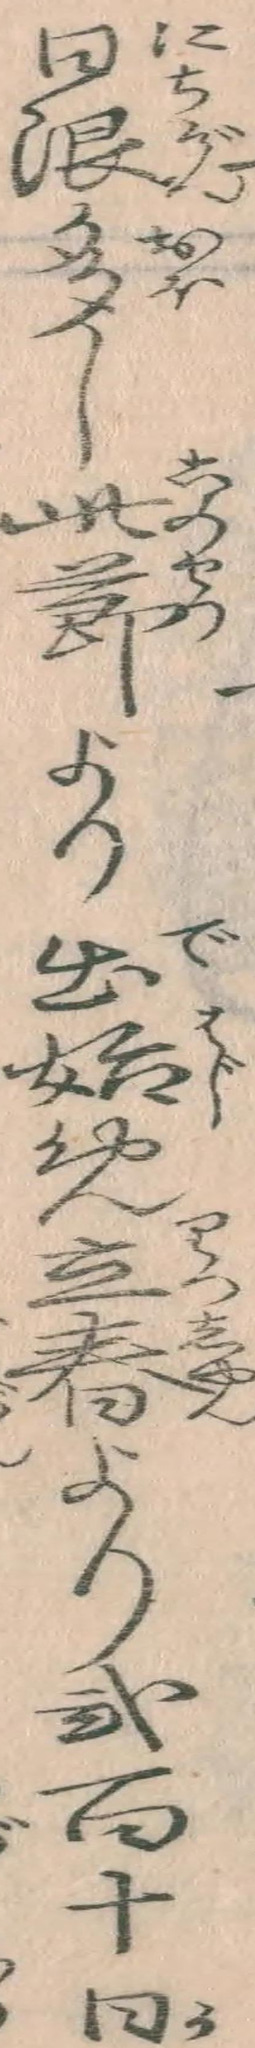日限多し此節より出始め立春より弐百十日
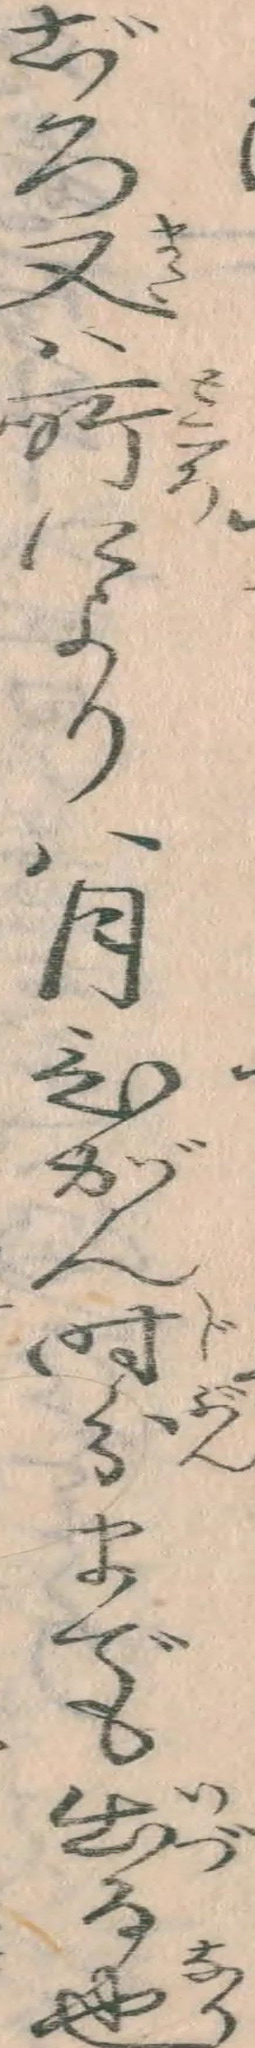ごろ又は所により八月ひがん時分までも出る也
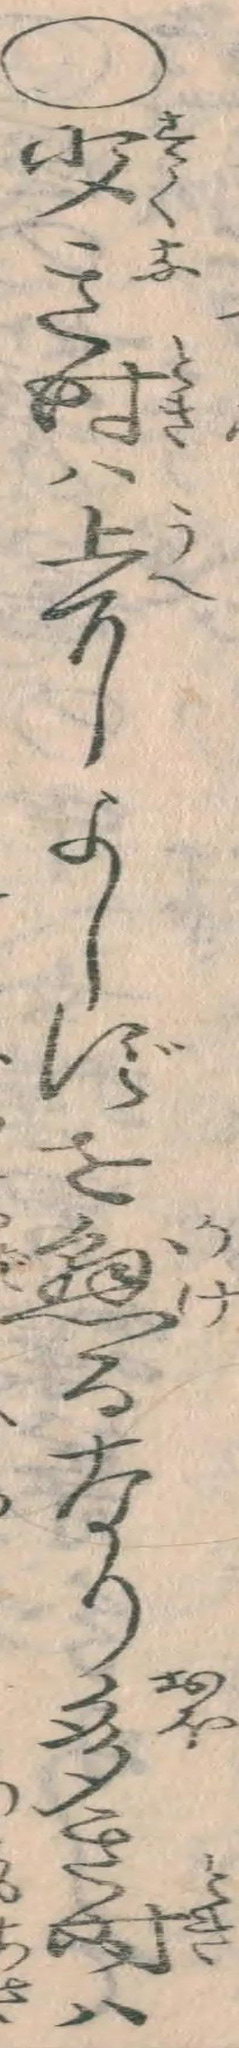○少き時は上によしずを懸るなり多き時は
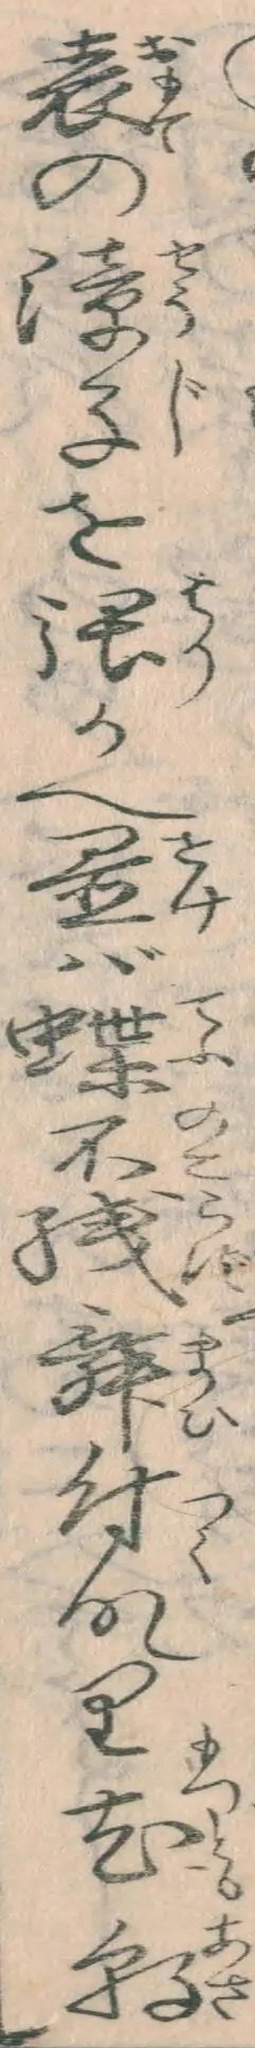表の障子を張かへ置ば蝶不残舞付なり尤朝

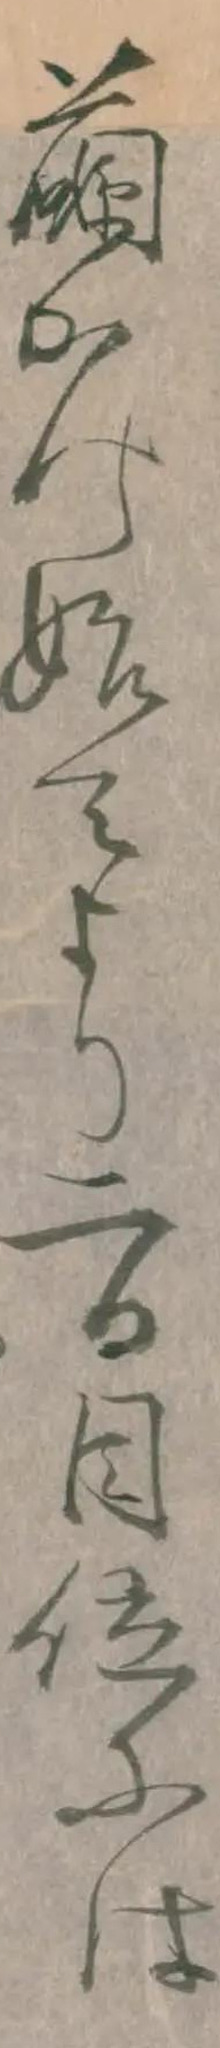繭かけ始てより二日目位には
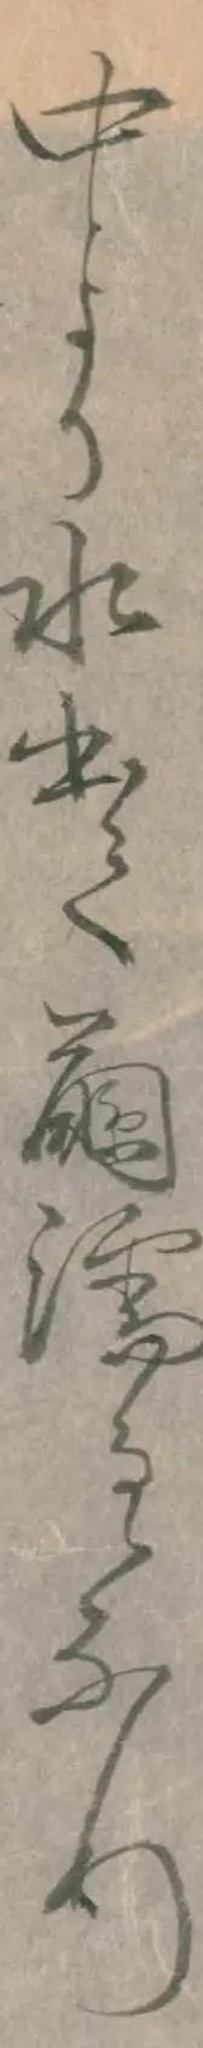中より水出て繭濡るゝなり
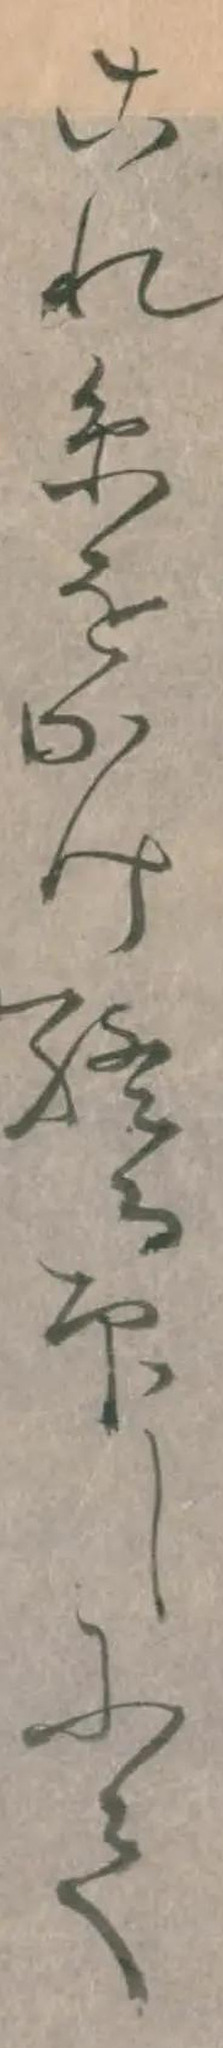これ糸をかけ終る印しにて
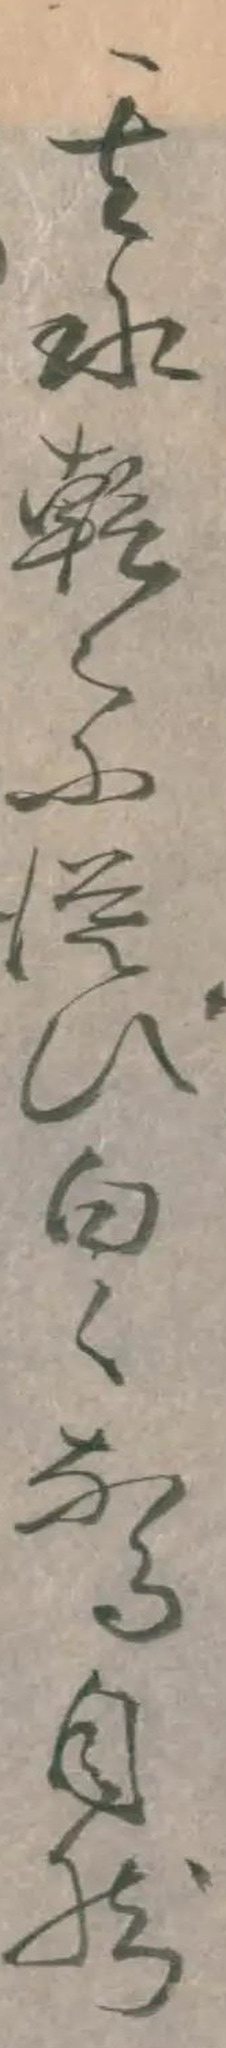其水乾くに従ひ白くなる自然
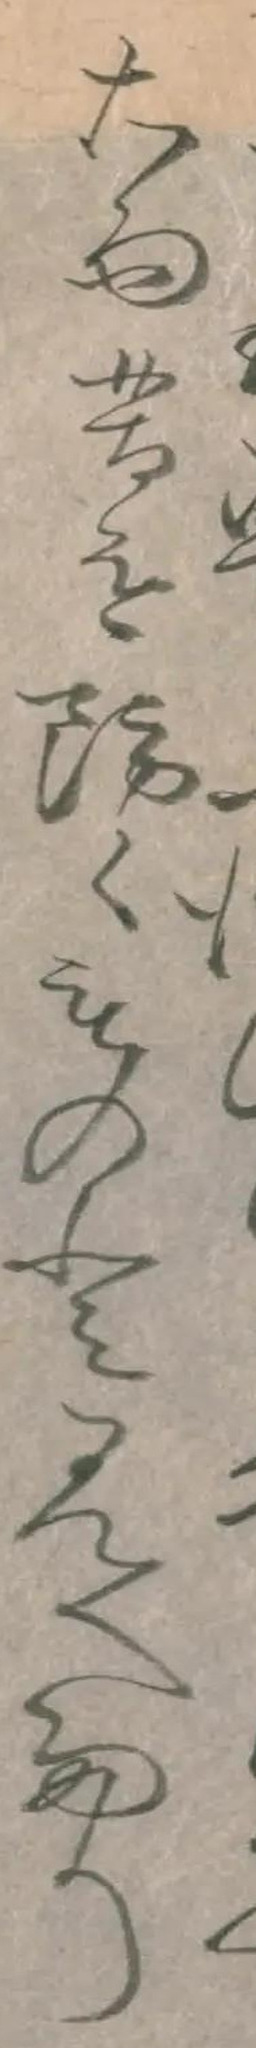大雨？等？を防くものと見へたり

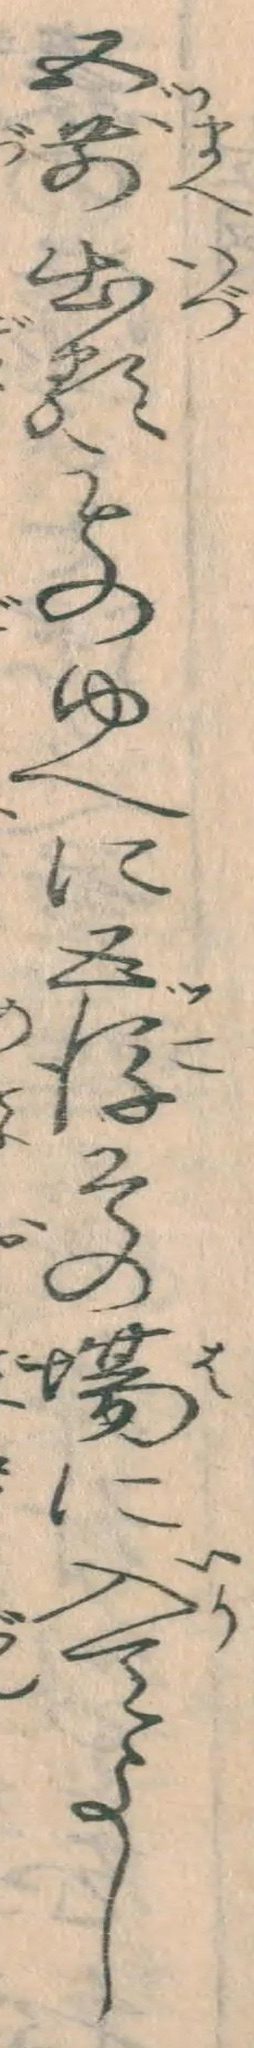五ツ前出るものゆへに五ツ後その場に入てよし
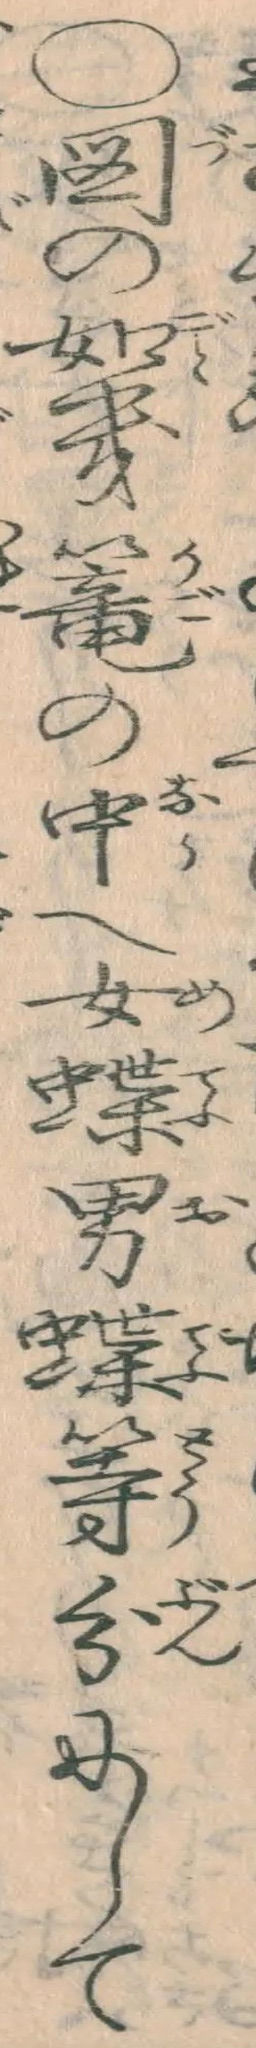○図の如き篭の中へ女蝶男蝶等分にして
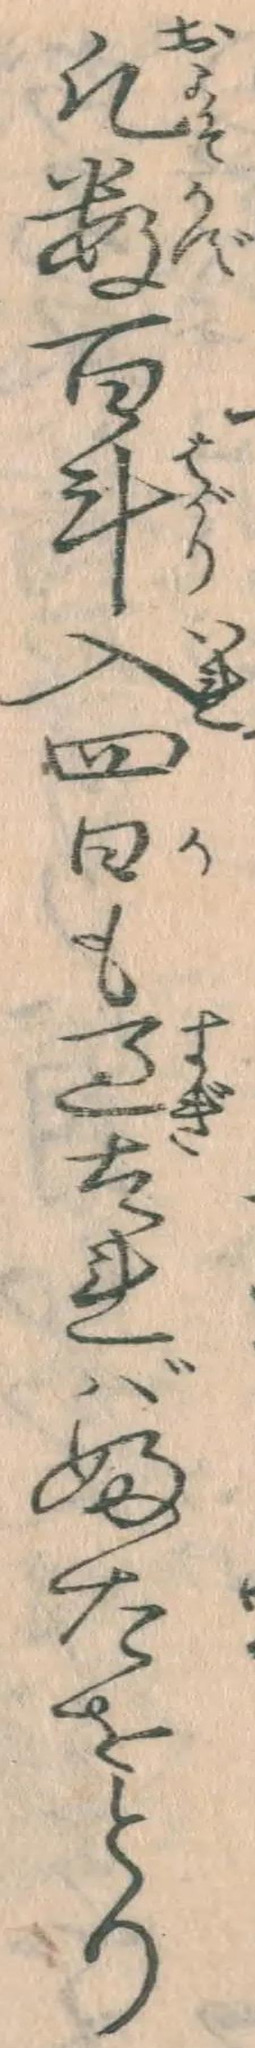凡数百斗入四日も過たればふたをとり
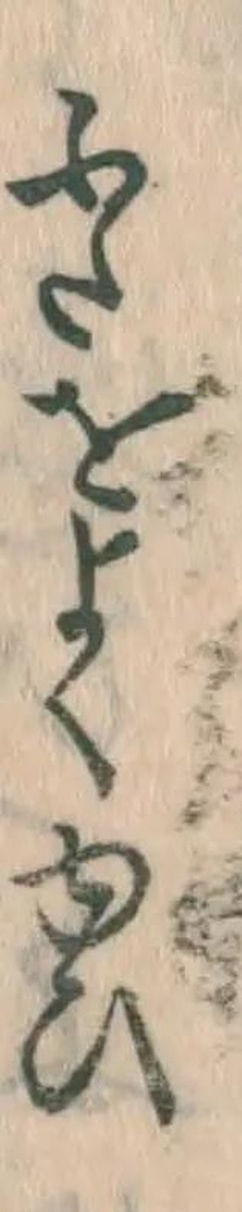ふたをよくゆひ
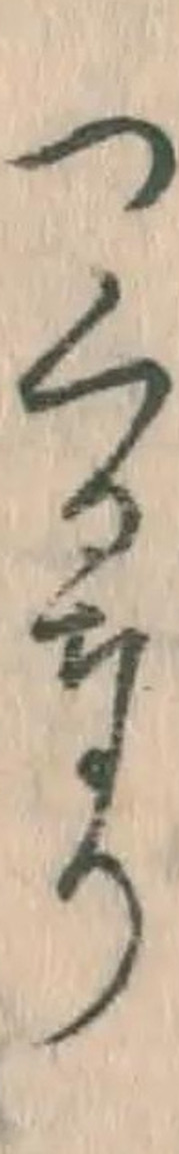つくるなり
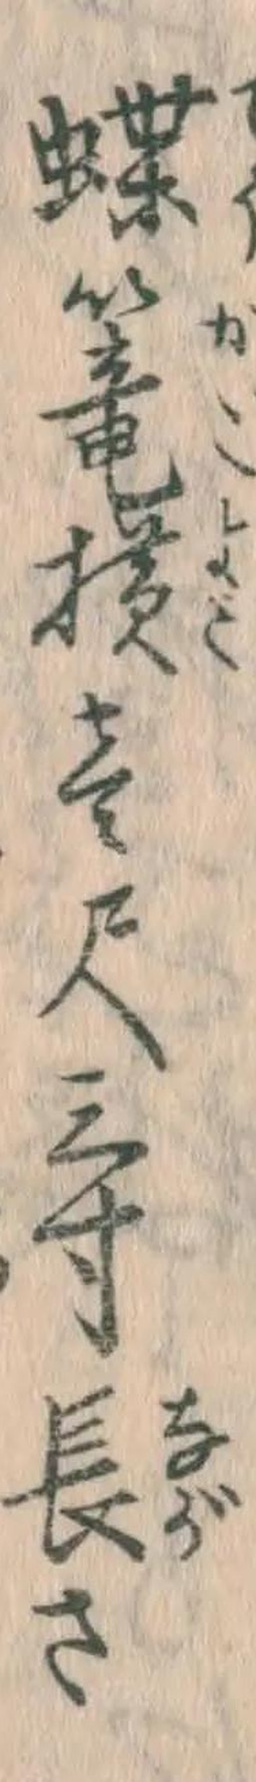蝶篭横壱尺三寸長さ
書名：山繭養法秘傳抄
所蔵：国立国会図書館 National Diet Library, JAPAN
